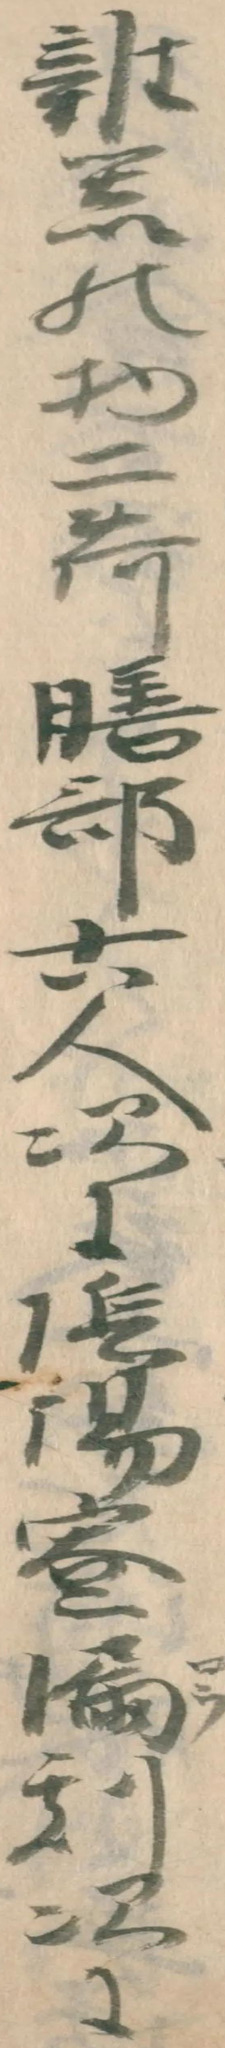雑器の物二荷膳部六人次に陰陽寮漏刻次に
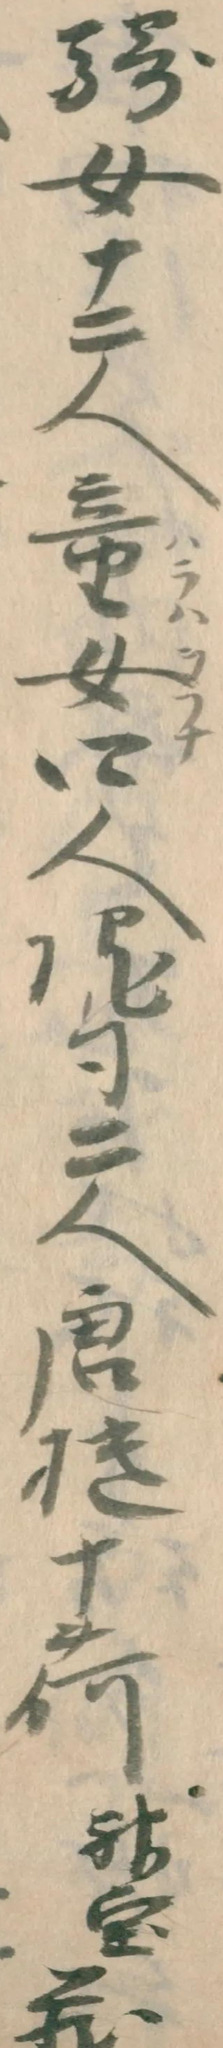騎女十二人童女四人院-司二人唐櫃十荷神宝蔵

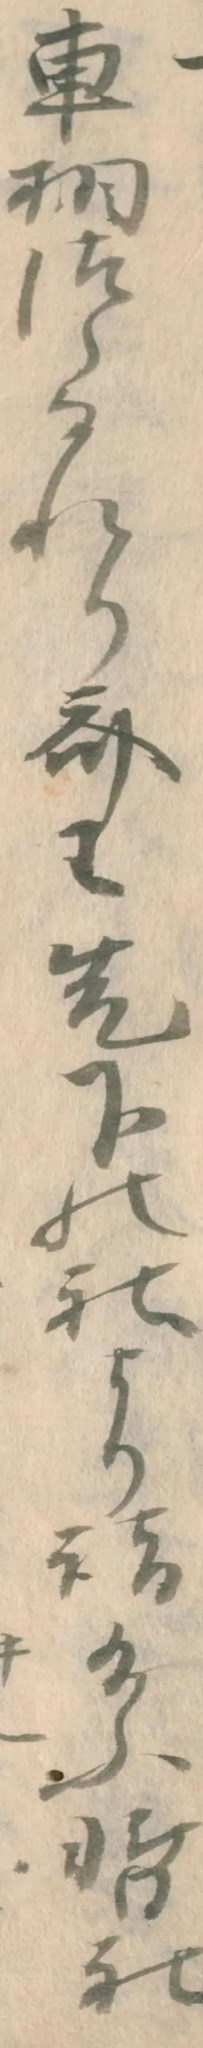車相つらなれり斎王は先下の社より詣給ふ暫社
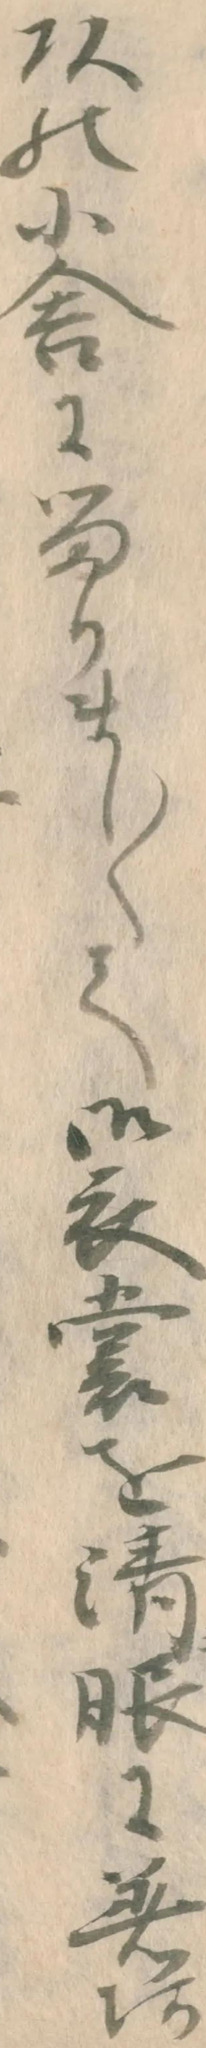頭の小舎に留りまし〳〵て御衣裳を清服に着あ
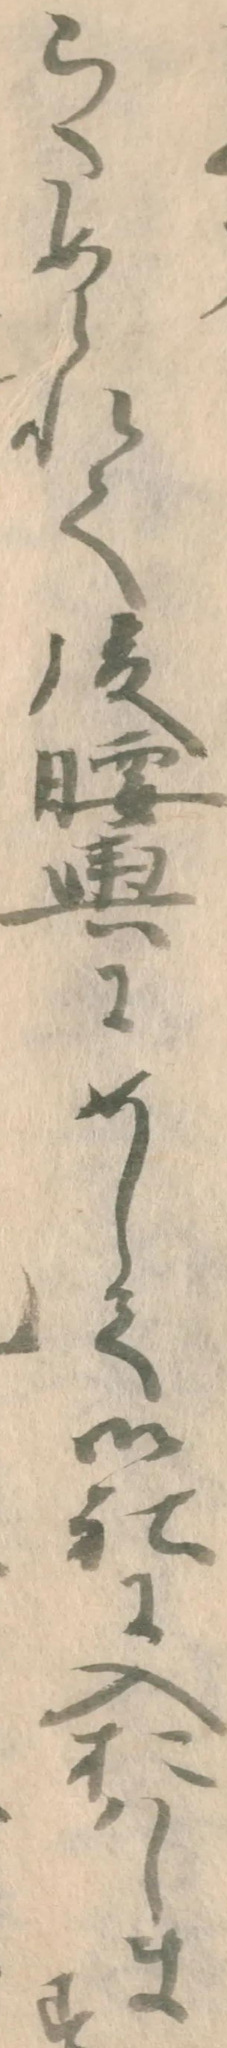らためられて後腰輿にめして御社に入おはします
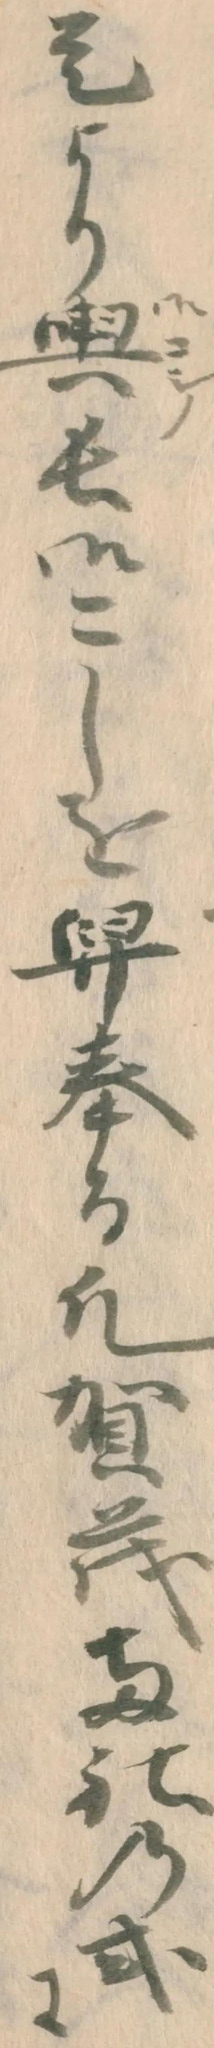是より輿長御こしを舁奉る凡賀茂両社の式に
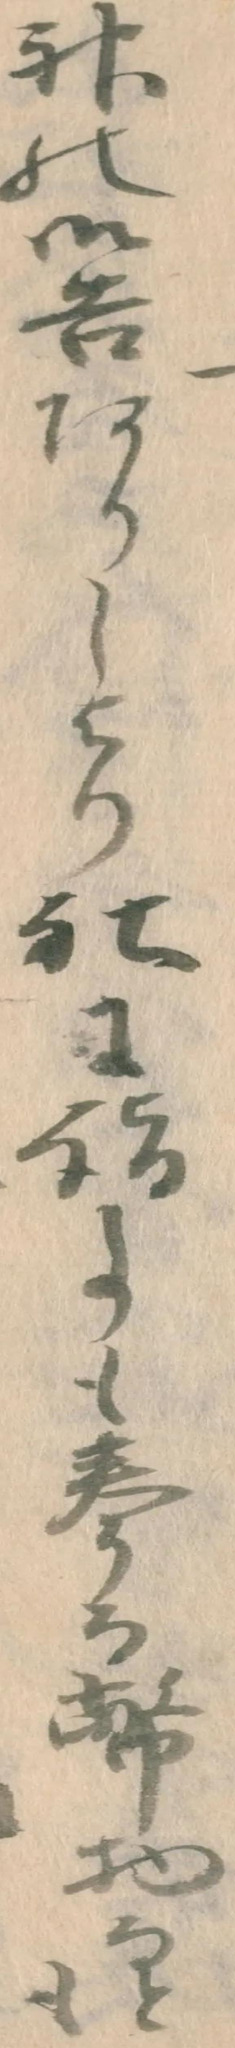神の御告ありしより社に詣事も奉る幣物なとも
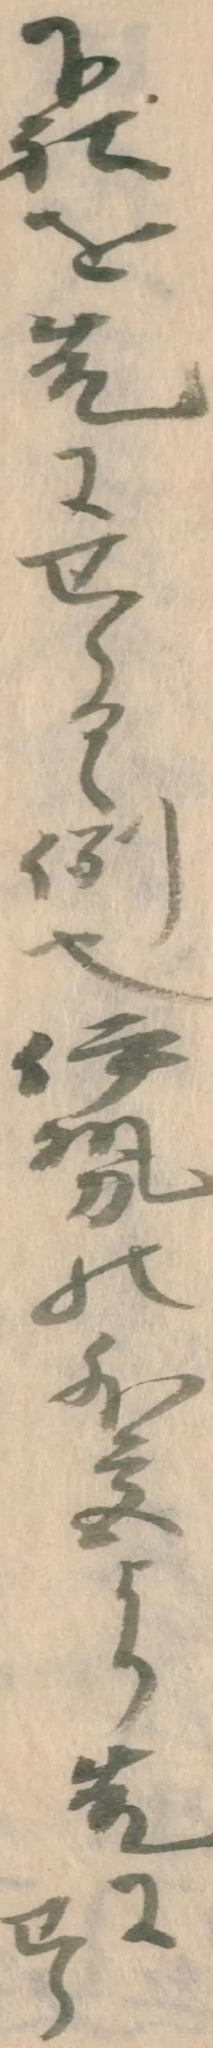下社を先にせらるゝ例也伊勢の外宮より先にせら
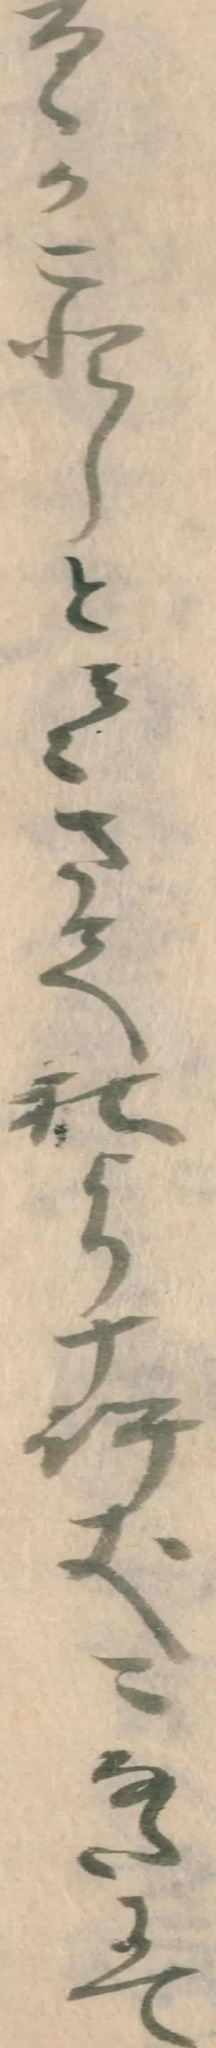るゝかことしと云々さて社より十許丈こなたにて
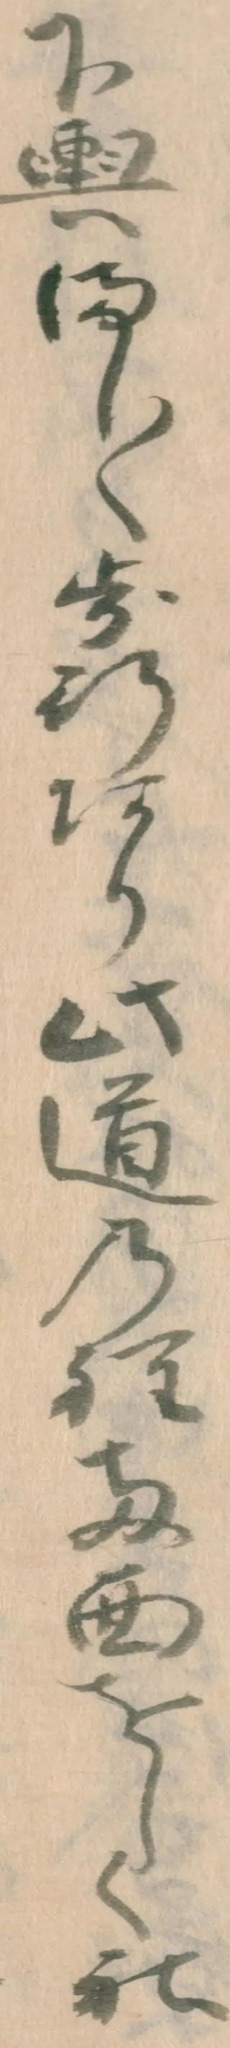下輿まし〳〵歩行あり此道の程両面をしく社
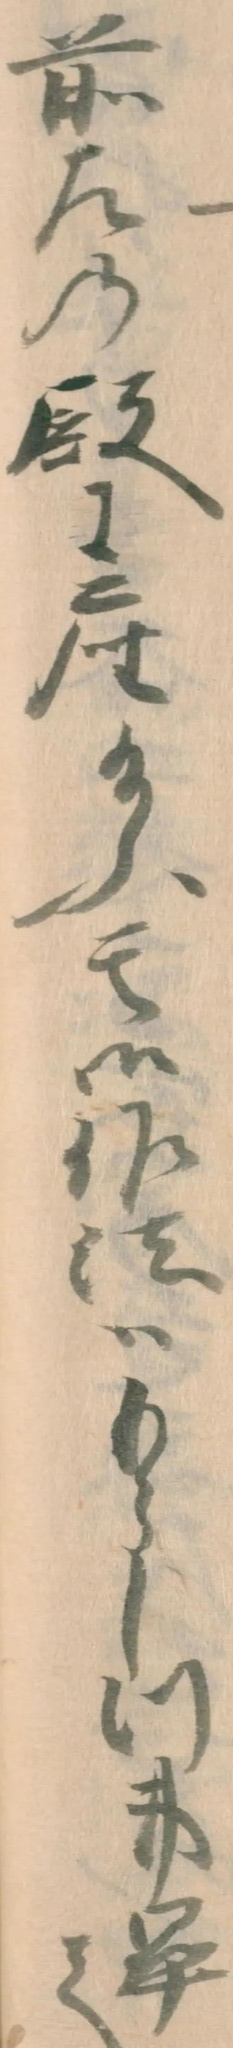前左の殿に座給ふ其御作法はもらしつ事畢て
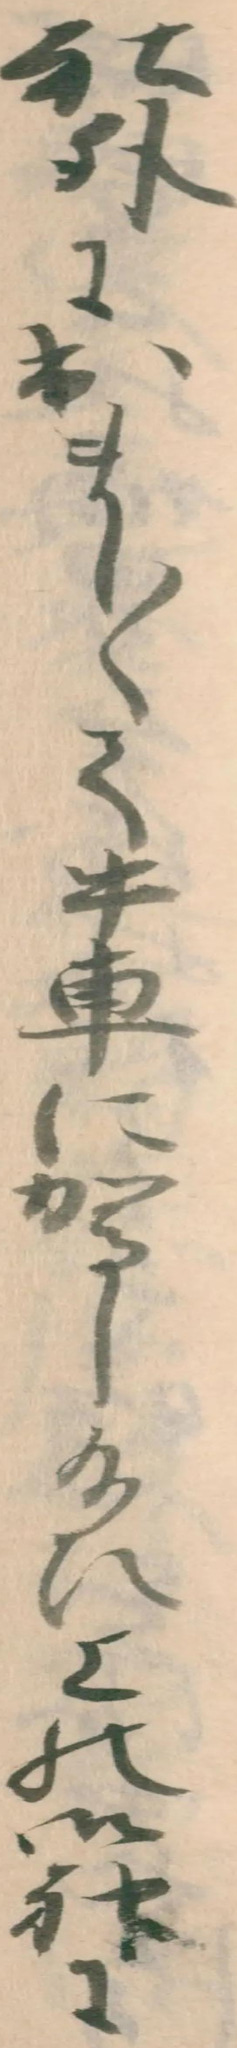社外に出まし〳〵て牛車に駕し給ひ上の御神に
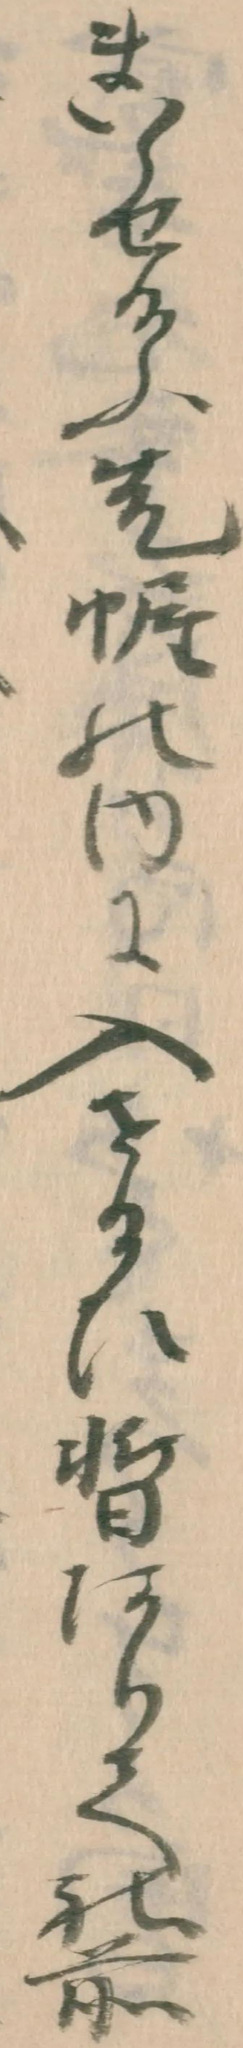まいらせ給ふ先幄の内に入せ給ひ暫ありて社前
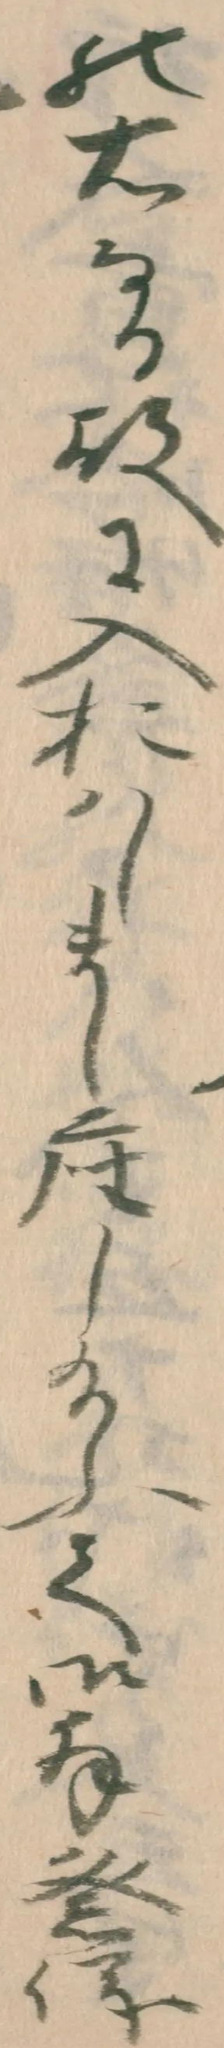の右なる殿に入おはしまし座し給ふて御拝祭儀
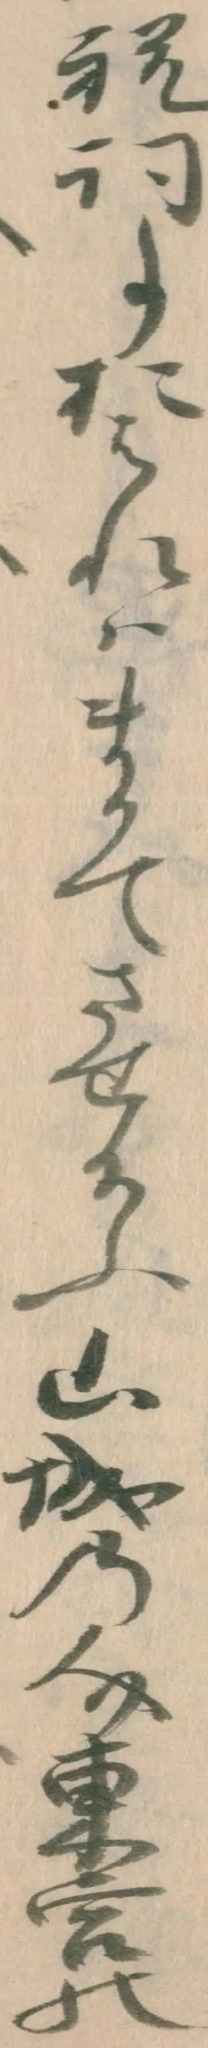祝詞事おはれはまかてさせ給ふ山城の介東宮の
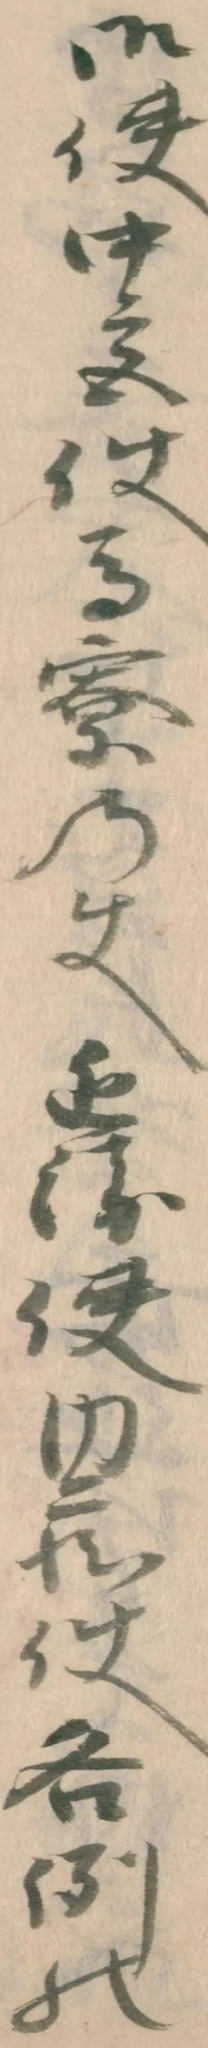御使中宮使馬寮の使近衛使内蔵使各例の
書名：賀茂社記録. 第1冊
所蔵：国立国会図書館 National Diet Library, JAPAN
